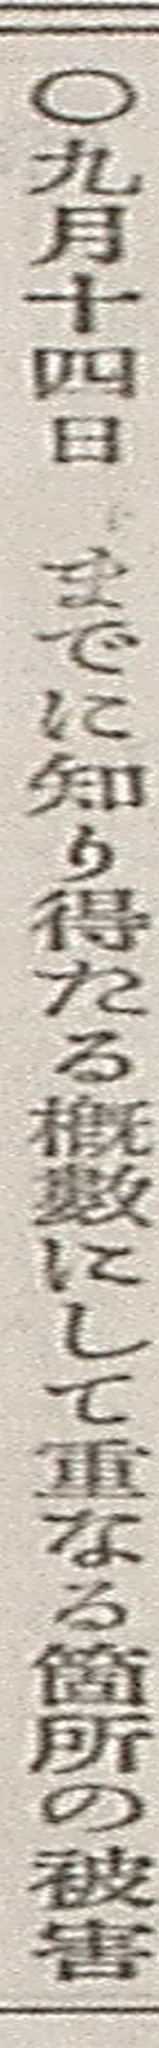◯九月十四日までに知り得たる概数にして重なる箇所の被害
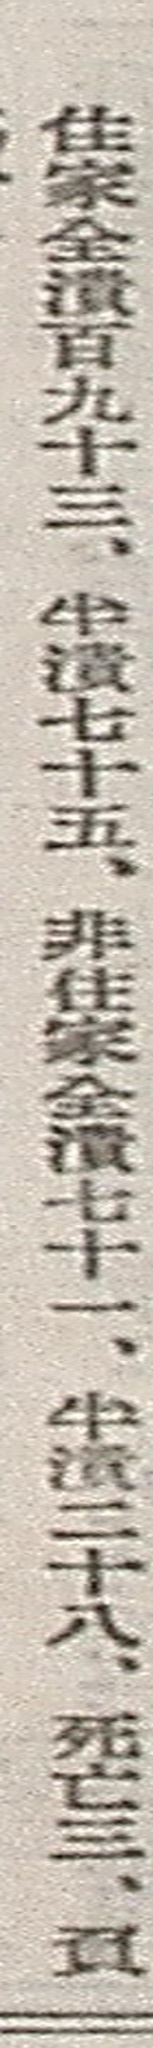住家全潰百九十三、半潰七十五、非住家全潰七十一、半潰二十八、死亡三、負
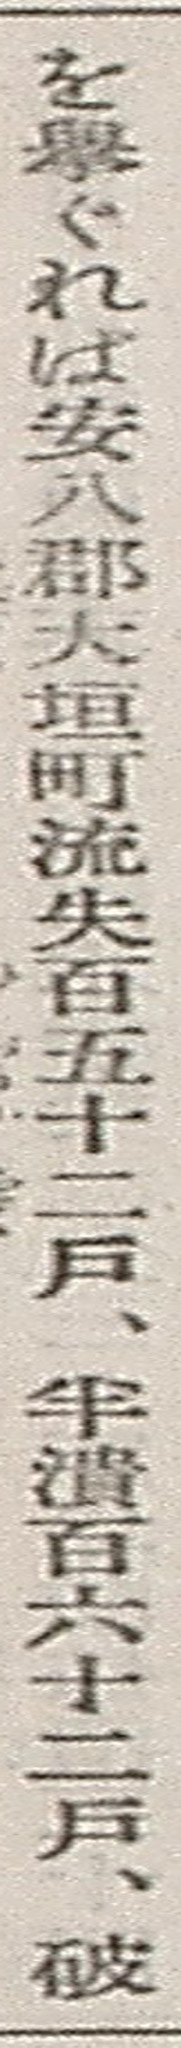を挙ぐれば安八郡大垣町流失百五十二戸、半潰百六十二戸、破
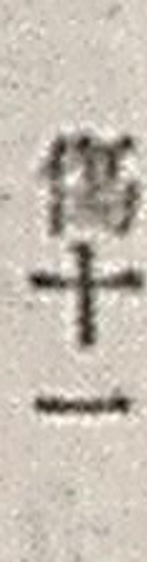傷十一
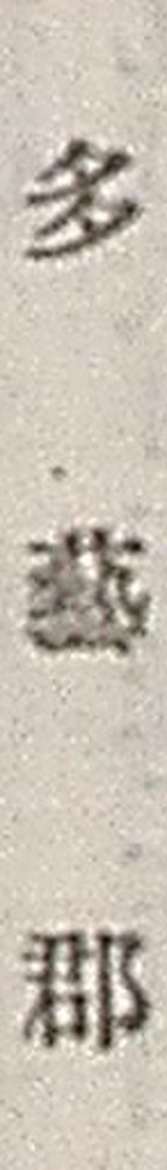多芸郡
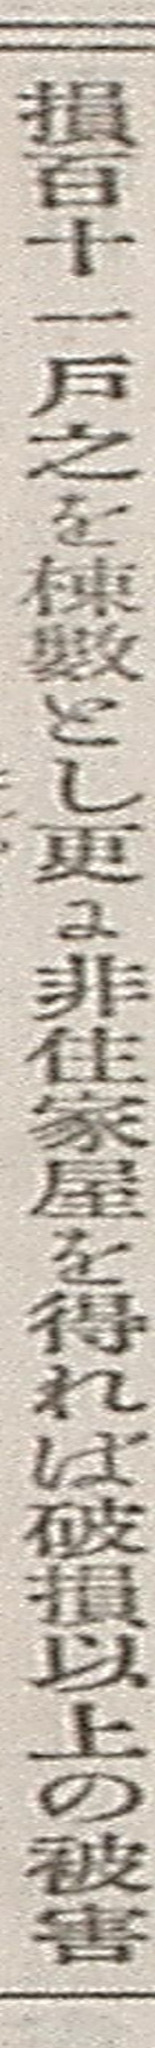損百十一戸之を棟数とし更に非住家屋を得れば破損以上の被害
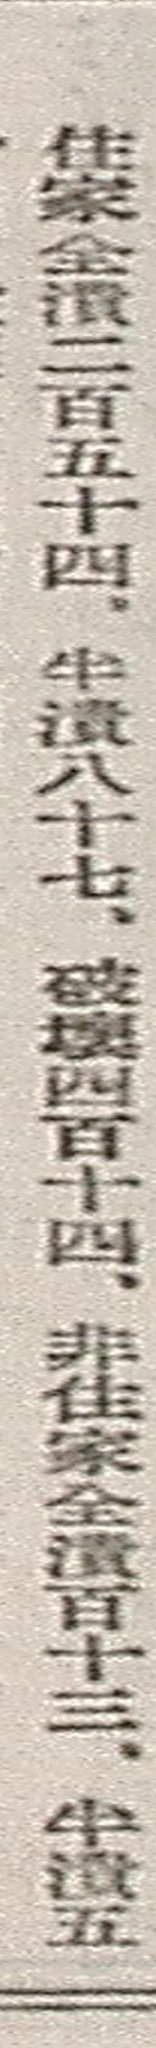住家全潰二百五十四、半潰八十七、破壊四百十四、非住家全潰百十三、半潰五
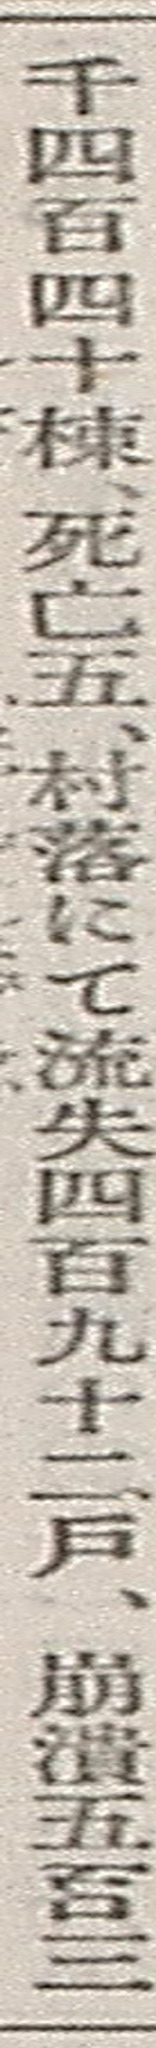千四百四十棟、死亡五、村落にて流失四百九十二戸崩潰五百三
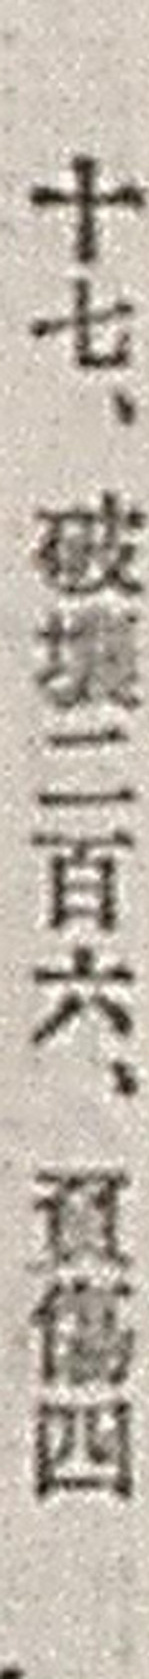十七、破壊二百六、負傷四
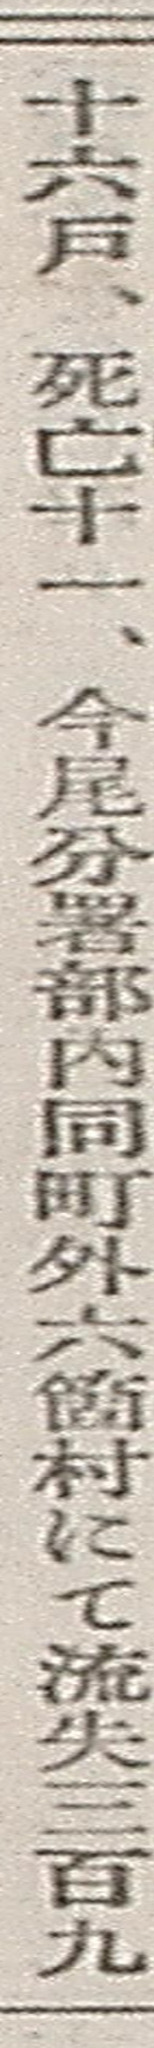十六戸、死亡十一、今尾分署部内同町外六箇村にて流失三百九
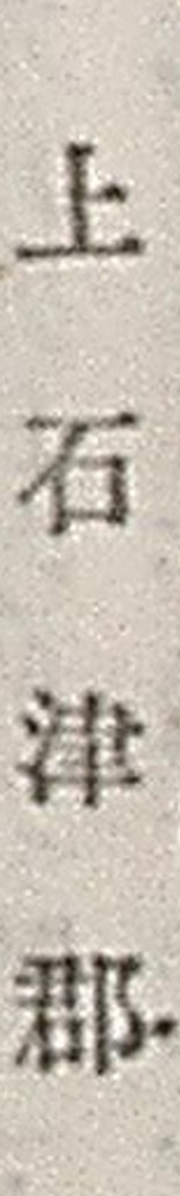上石津郡
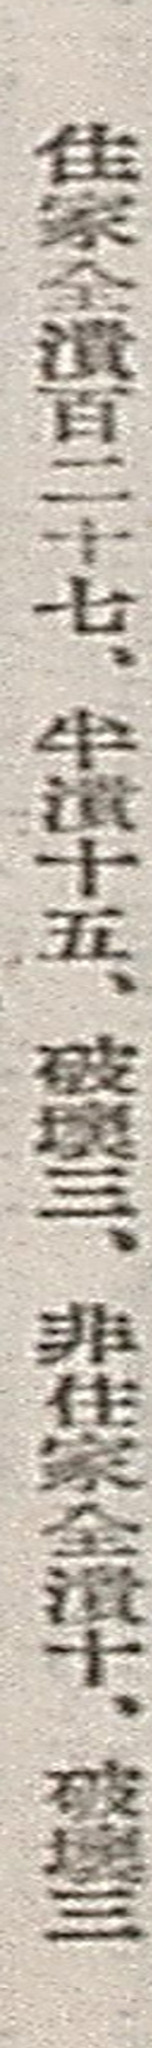住家全潰百二十七、半潰十五、破壊三、非住家全潰十、破壊三
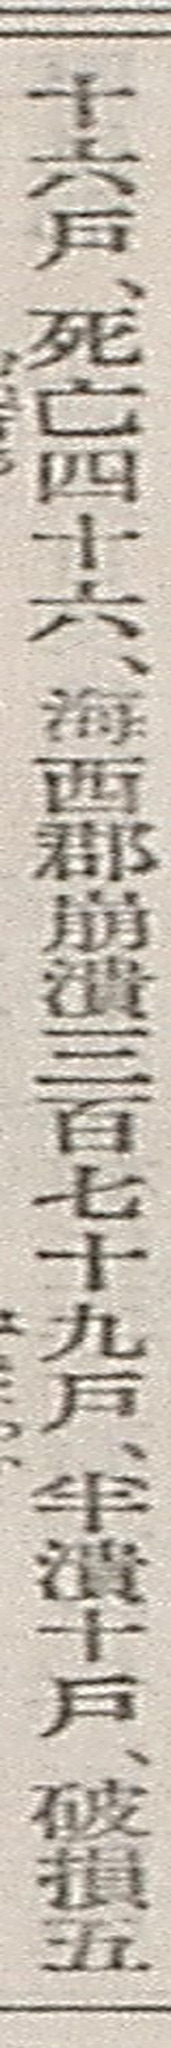十六戸、死亡四十六、海西郡崩潰三百七十九戸、半潰十戸、破損五
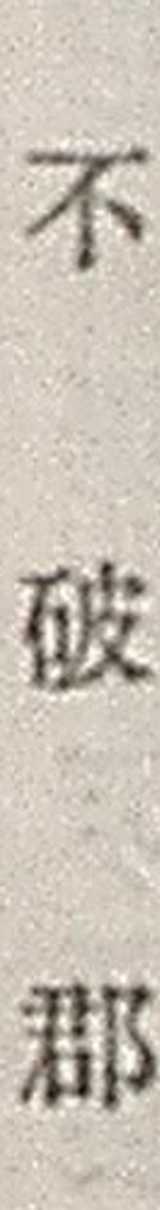不破郡
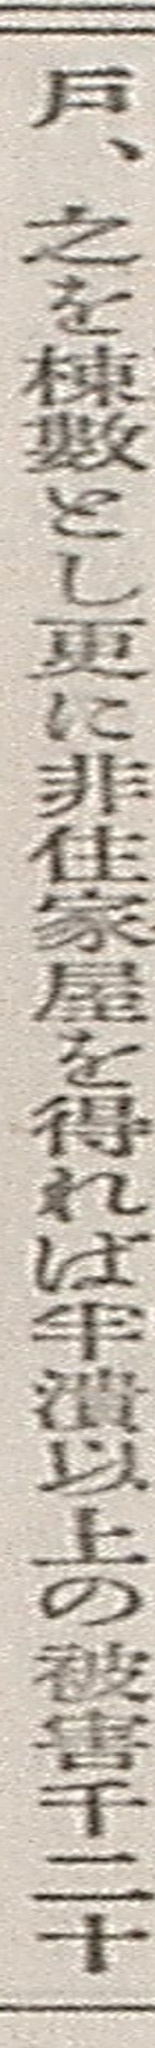戸、之を棟数とし更に非住かおくを得れば半潰以上の被害千二十
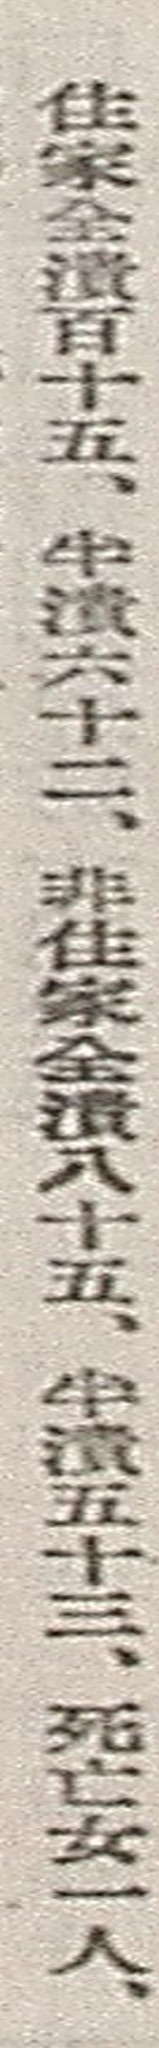住家全潰百十五、半潰六十二、非住家全潰八十五、半潰五十三、死亡女一人
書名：風俗畫報臨時増刊第百二十六號　洪水被害録（中）
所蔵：東京大学地震研究所図書室 Earthquake Research Institute Library, The University of Tokyo, JAPAN
